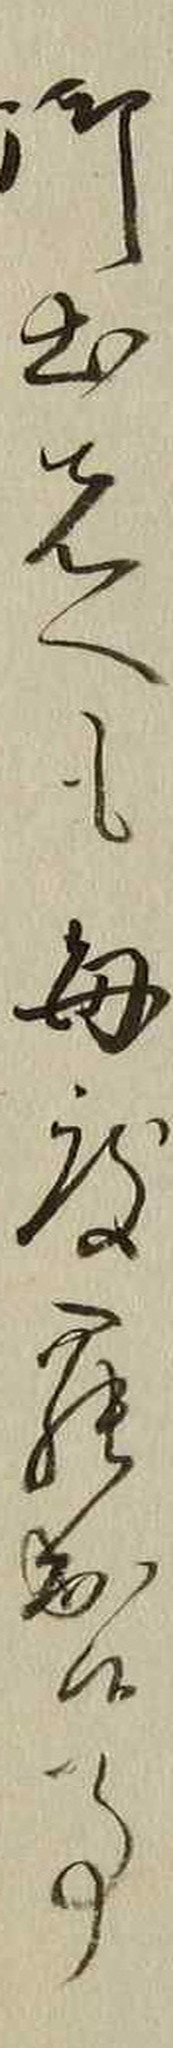御出先へも毎度罷出候事
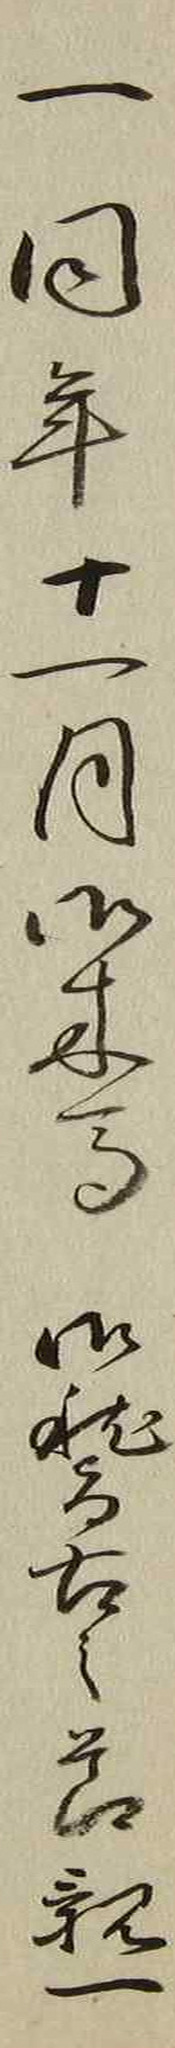一同年十一月御木馬御稽古之節親一
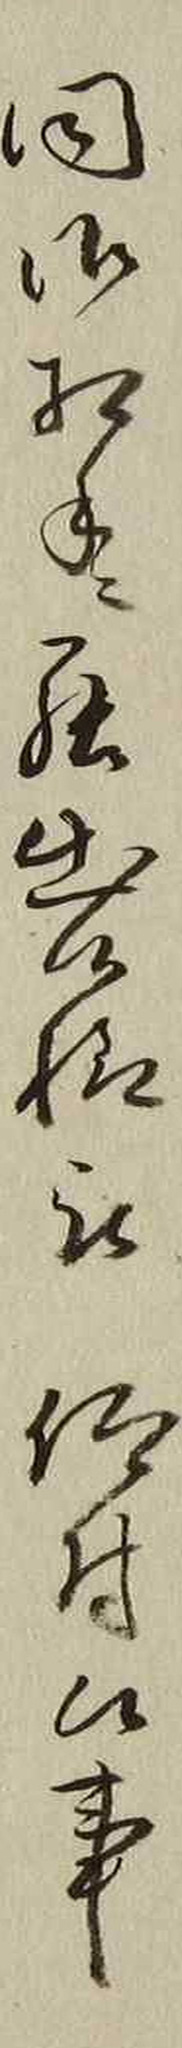同御相手ニ罷出候様被仰付候事
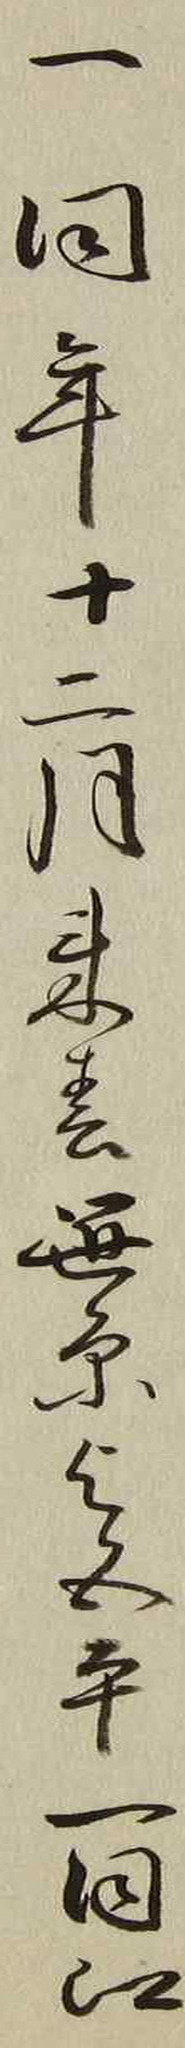一同年十二月来春笹原与五平一同江
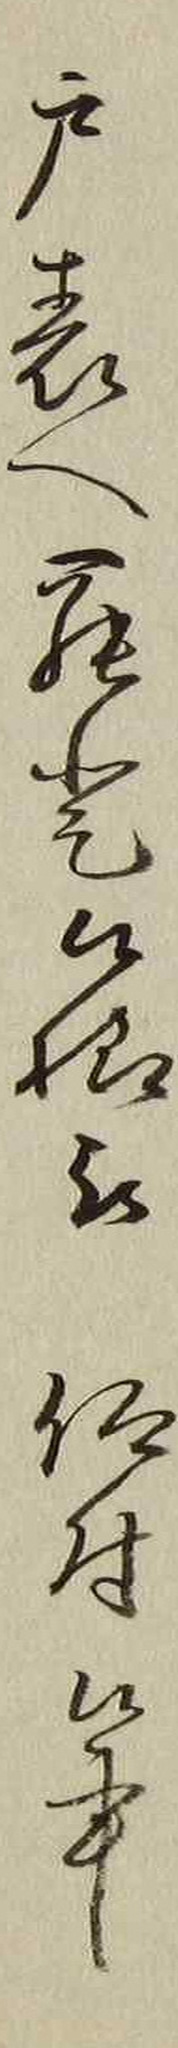戸表へ罷登候様被仰付候事
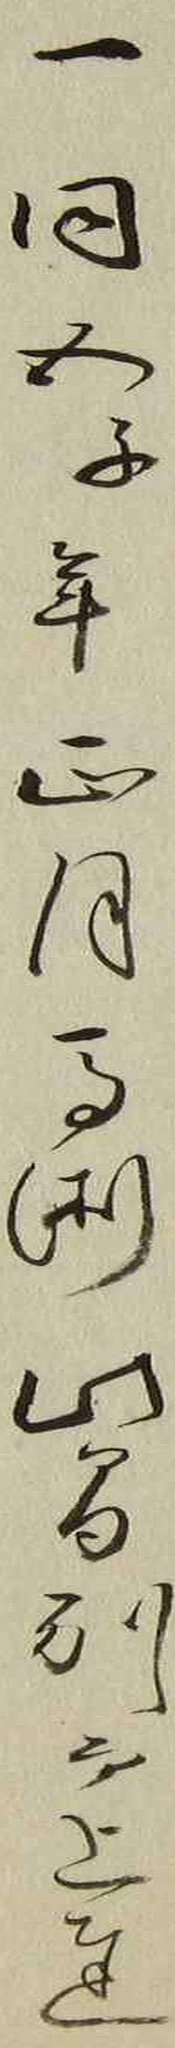一同五子年正月馬術此間別而上達
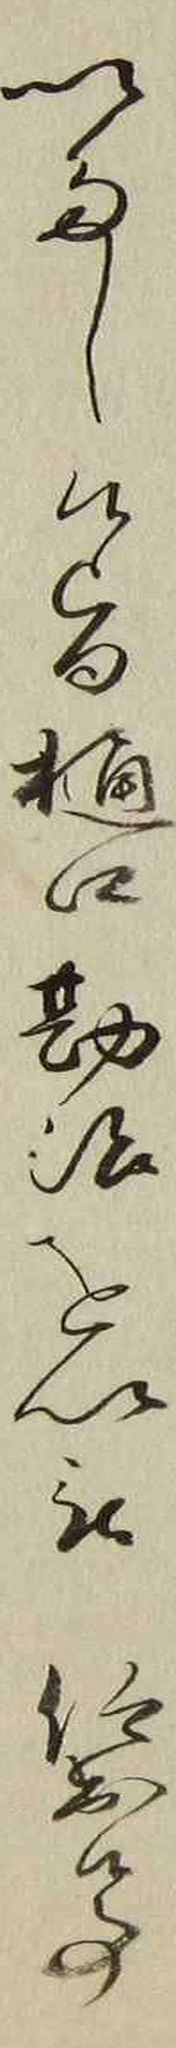いたし候旨樋口勘治を以被仰出候事
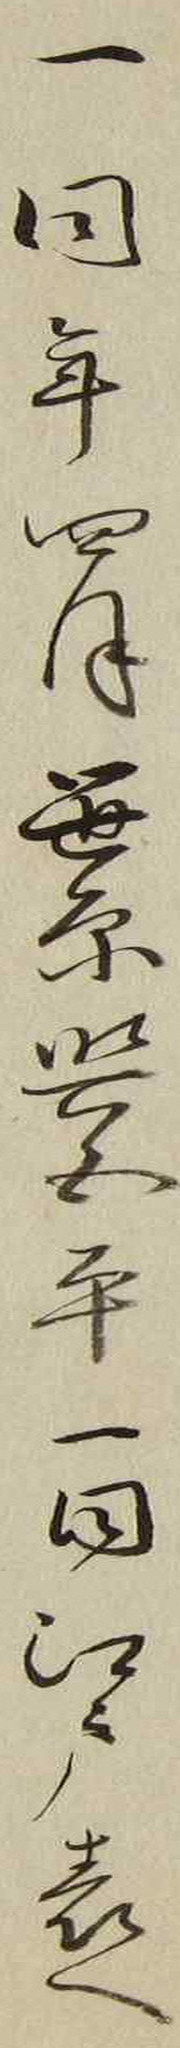一同年四月笹原與五平一同江戸表へ
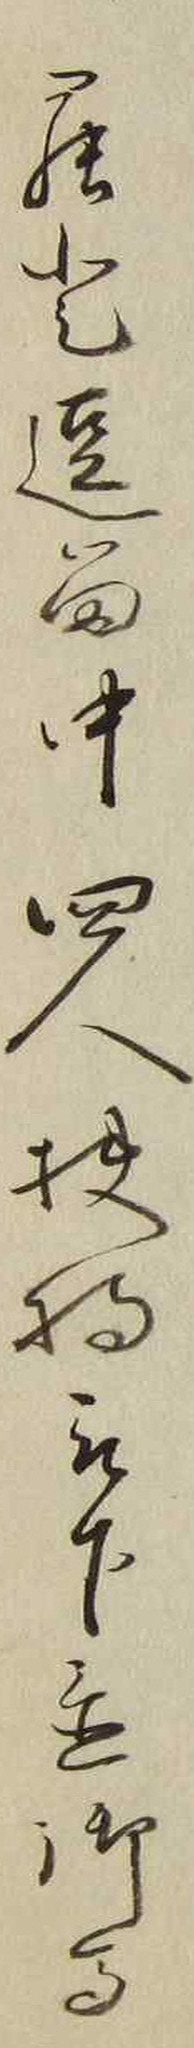罷登逗留中四人扶持被下置御馬

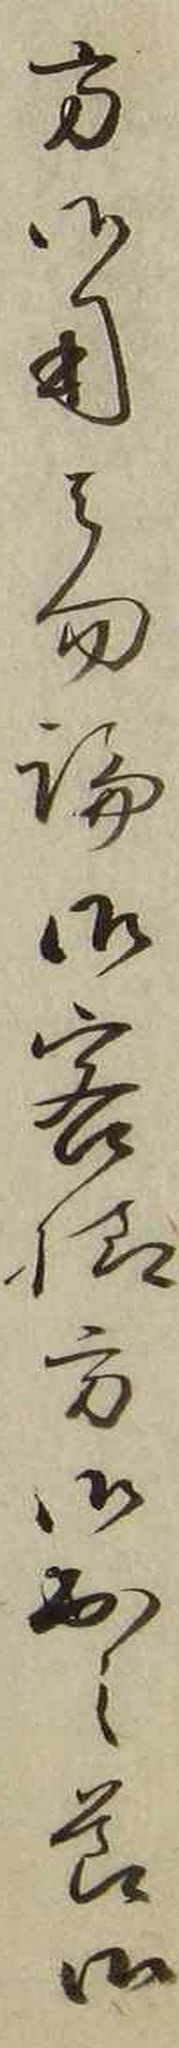方御用者勿論御客様方御出之節御
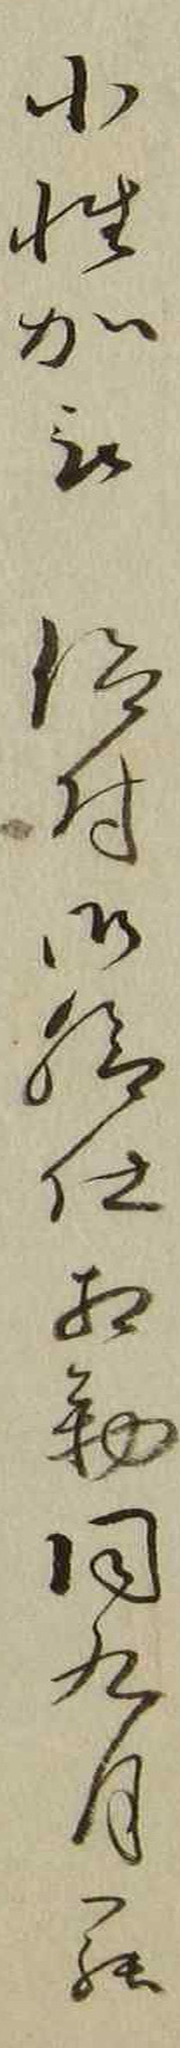小性加被仰付御給仕相勤同九月罷
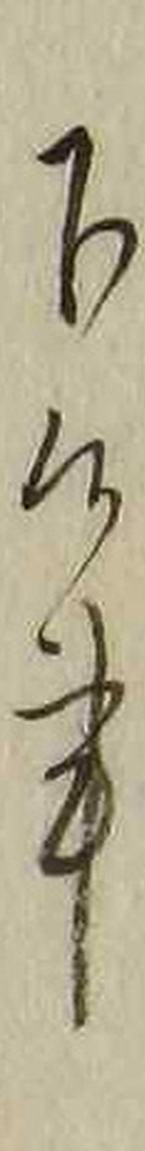下候事
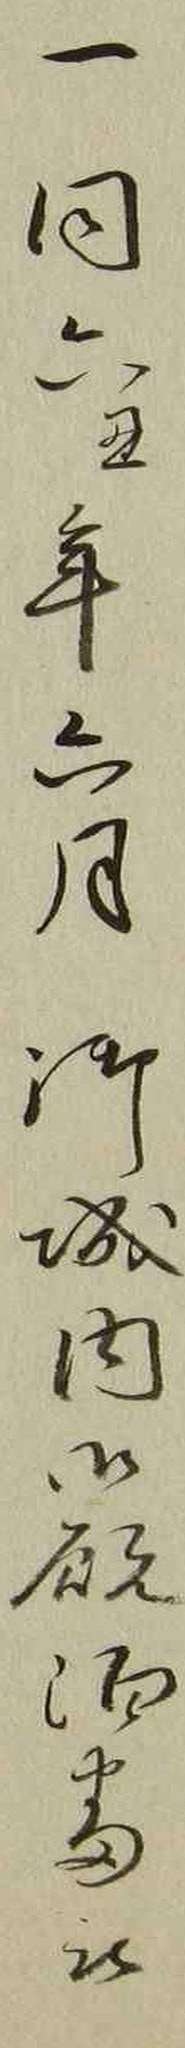一同六丑年六月御城内御厩泊番被
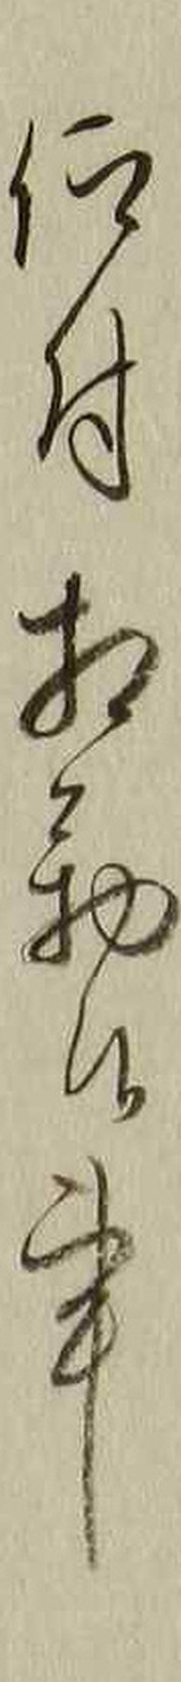仰付相勤候事
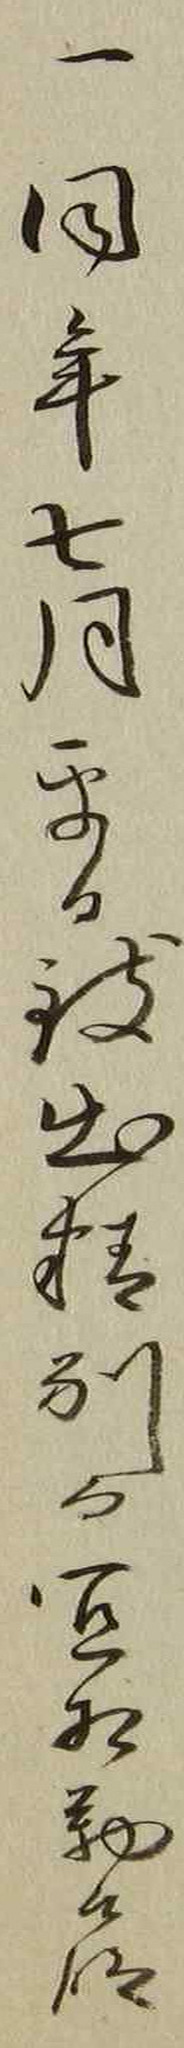一同年七月平日致出精別而宜相勤候段
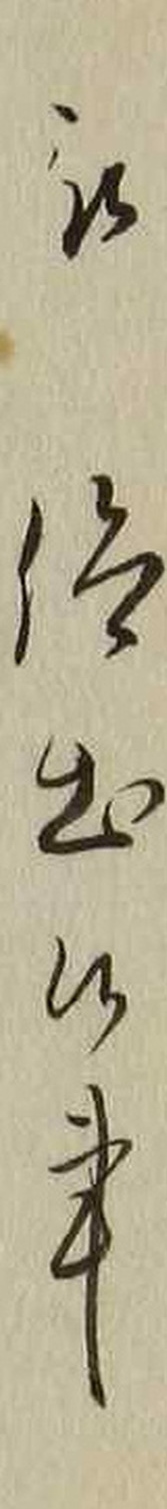被仰出候事
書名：諸士系譜　巻之3　い之部3
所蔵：会津若松市立会津図書館
